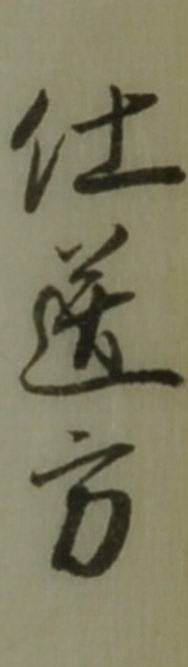仕送方
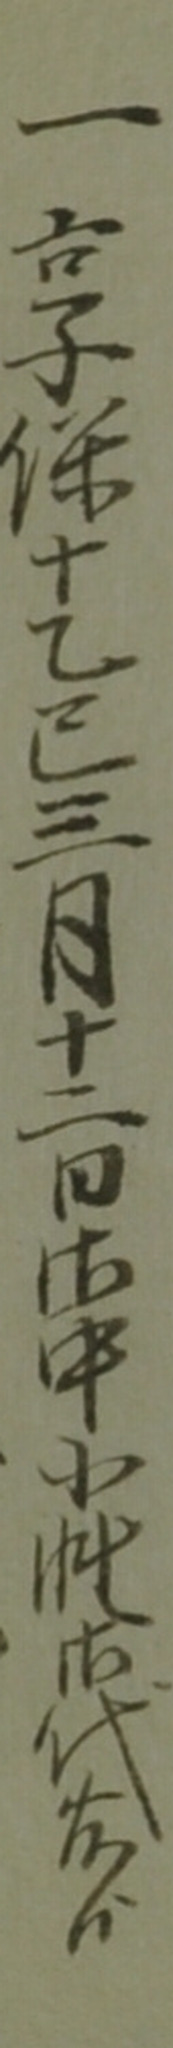一享保十乙巳三月十二日御中小性御代官より
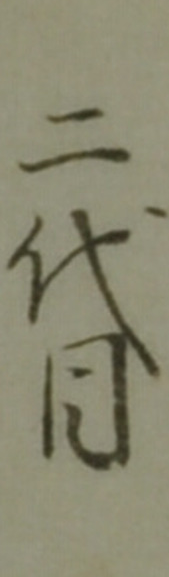二代目
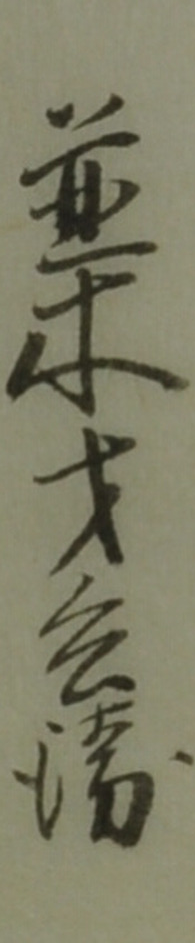並木才兵衛
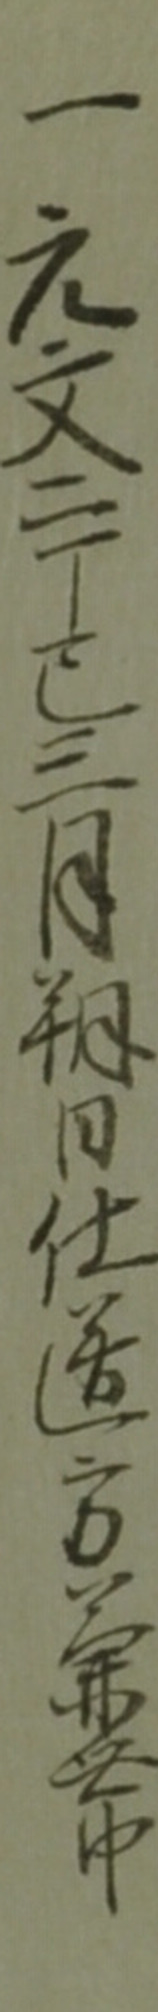一元文二丁巳三月朔日仕送方兼帯
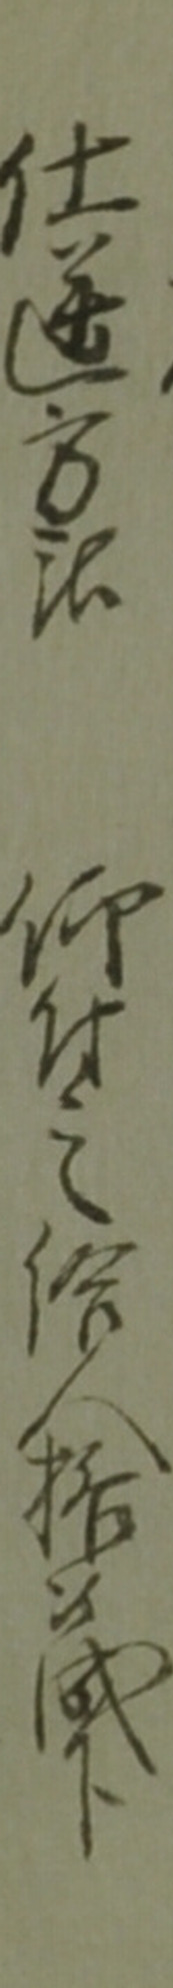仕送方被仰付之給人格被成下
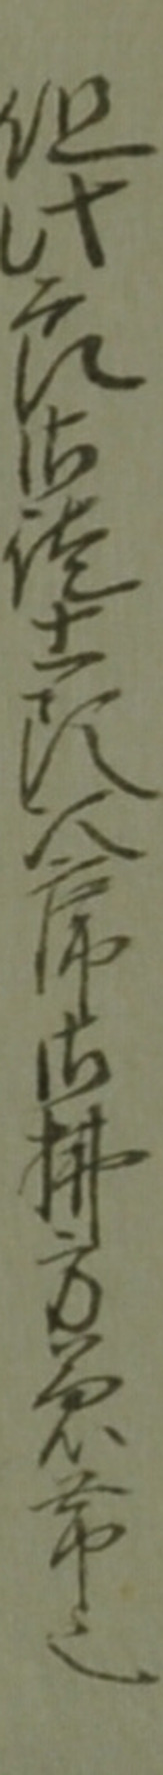但此節御徒士頭次席御払方兼帯也
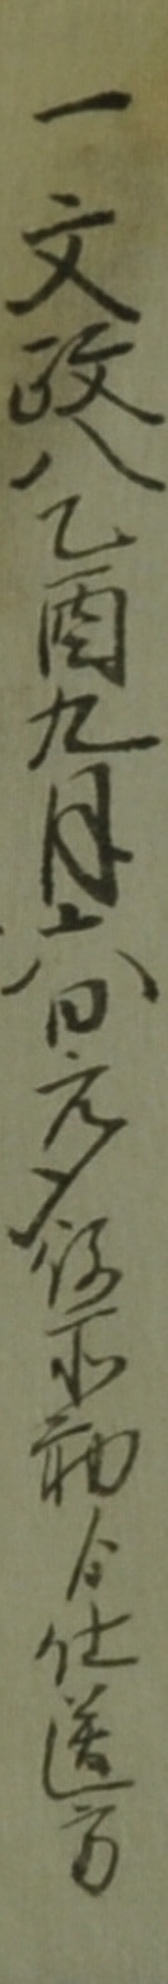一文政八乙酉九月六日元〆役所勤より仕送方
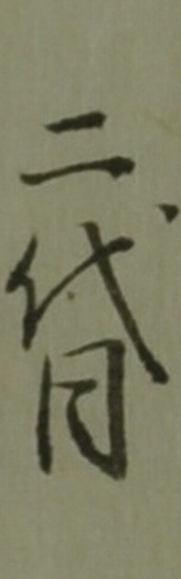二代目
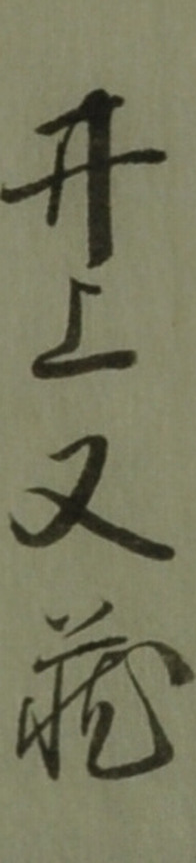井上又蔵
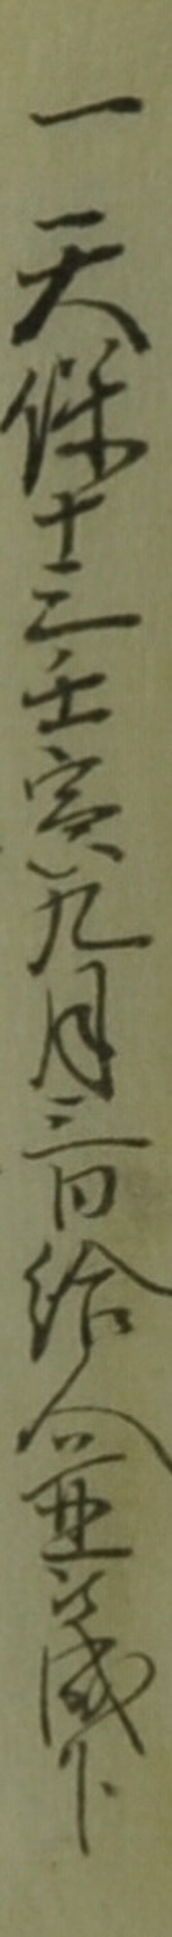一天保十三癸寅九月三日給人並被成下
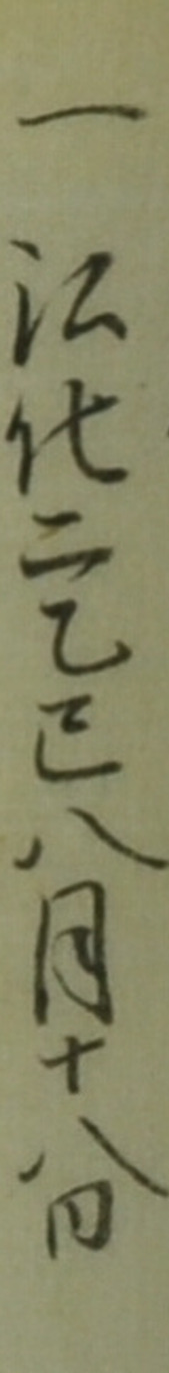一弘化二乙巳八月十八日
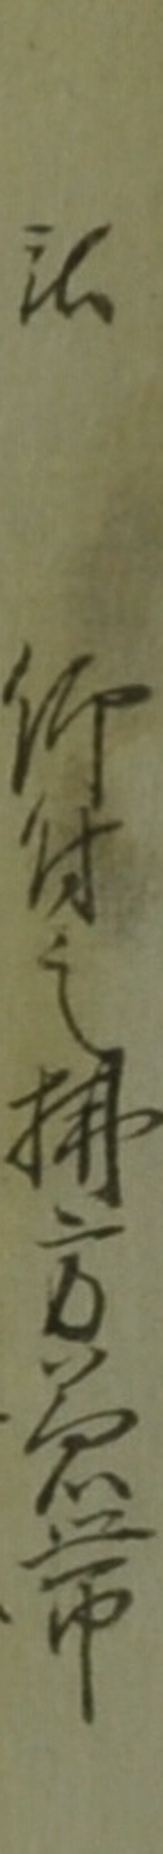被仰付之払方兼帯

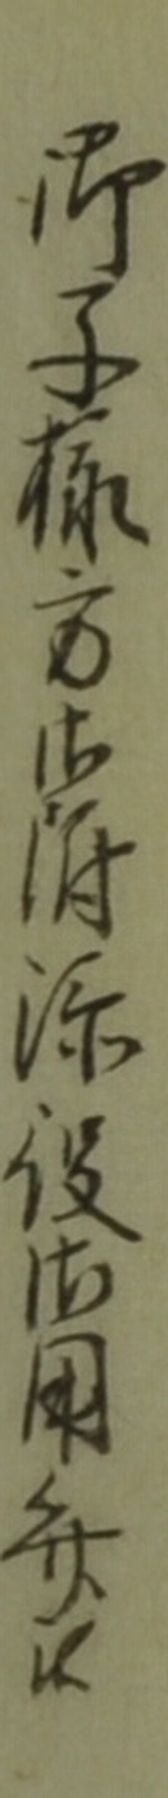御子様方御附添役御用弁被
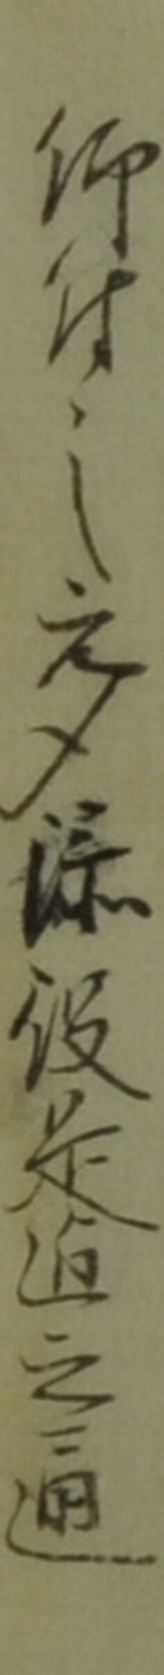仰付之元〆添役是迄之通

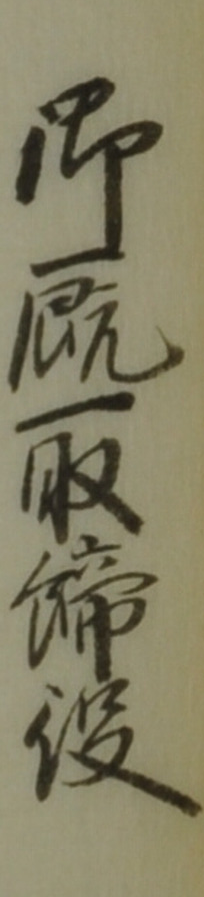御厩取締役
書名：諸御役代々録（八）
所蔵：伊那市立高遠町図書館・合同会社AMANE
